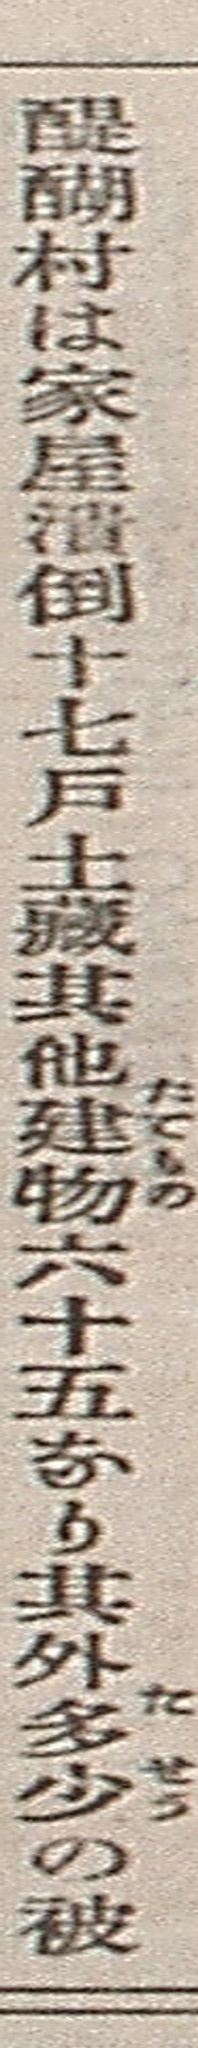醍醐村は家屋潰倒十七戸土蔵其他建物六十五なり其外多少の被
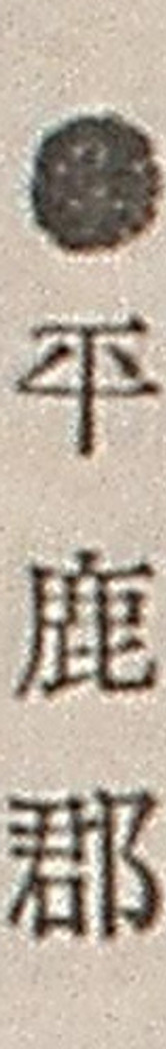●平鹿郡
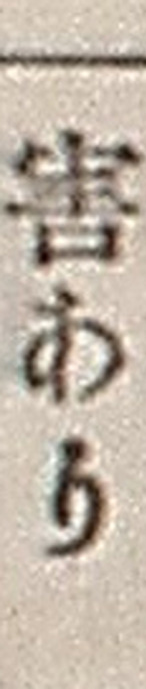害あり
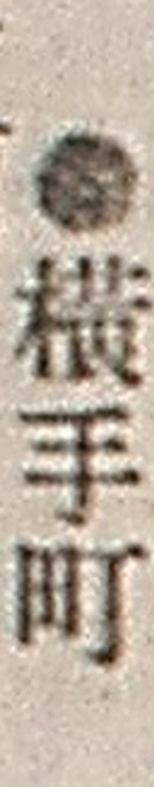●横手町
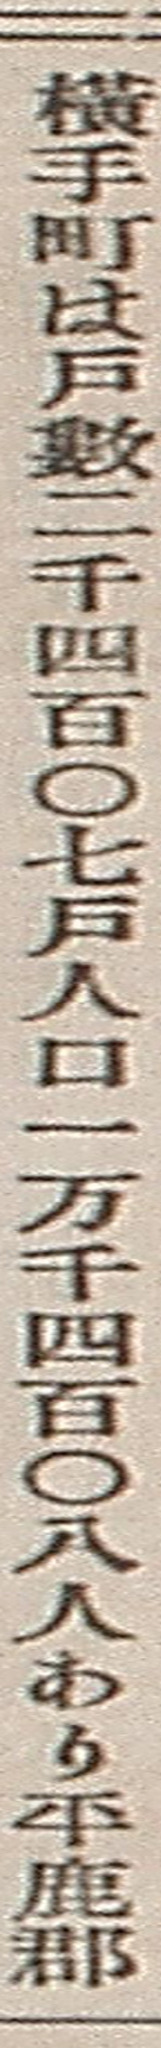横手町は戸数二千四百〇七戸人口一万千四百〇八人あり平鹿郡
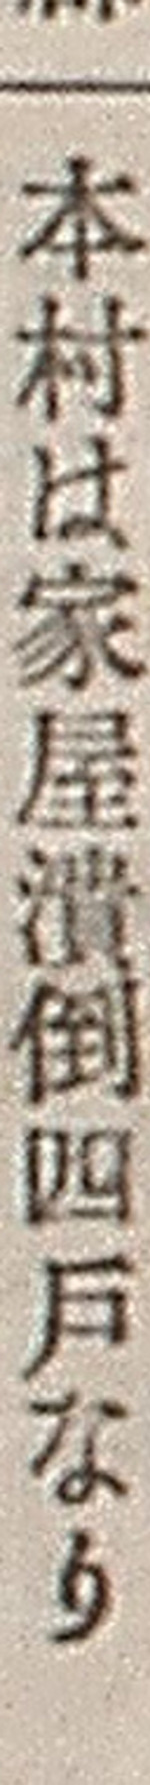本村は家屋潰倒四戸なり

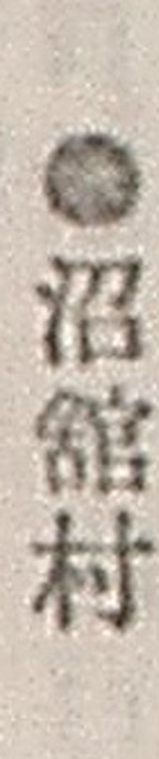●沼舘村
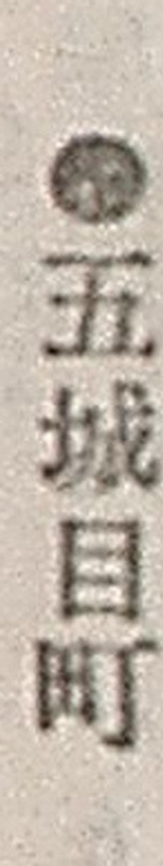●五城目町
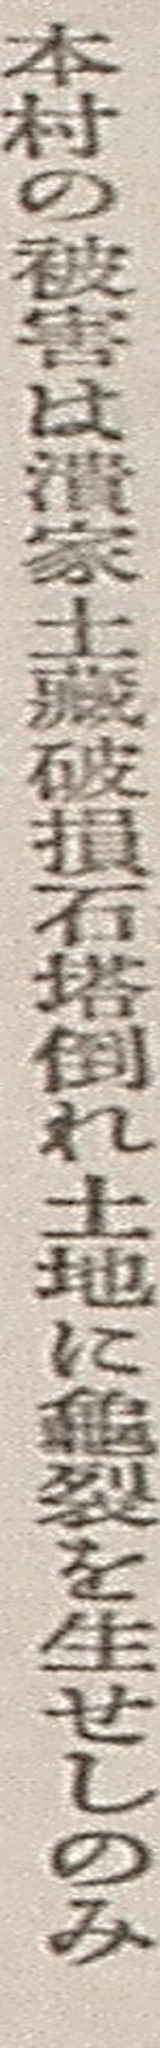本村の被害は潰家土蔵破損石塔倒れ土地に亀裂を生せしのみ
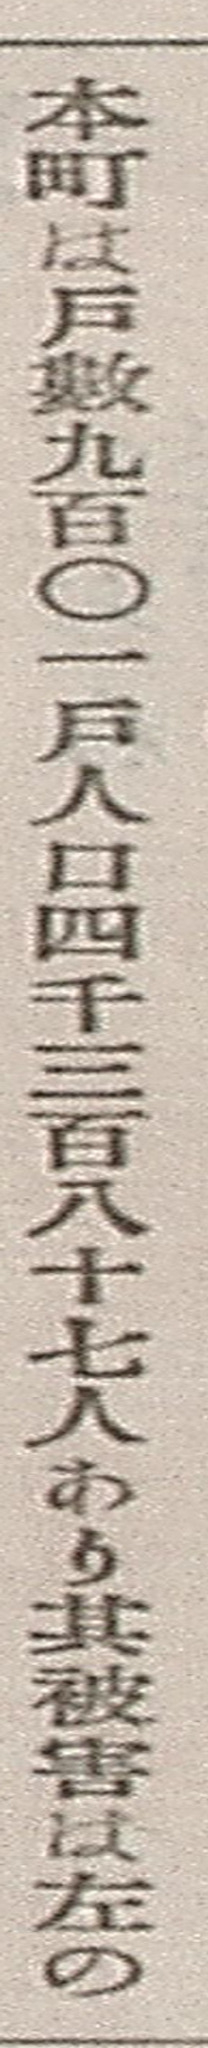本町は戸数九百〇一戸人口四千三百八十七人あり其被害は左の
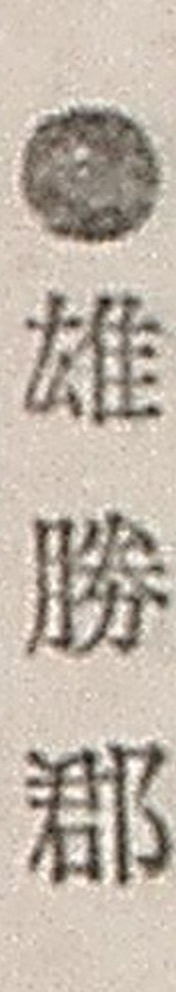●雄勝郡
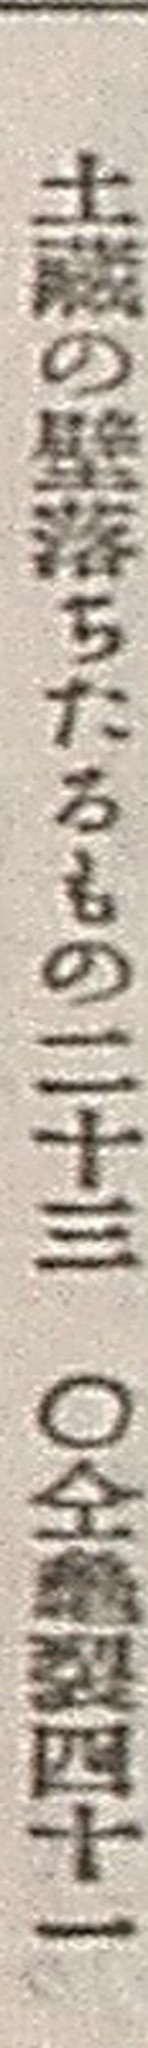土蔵の壁落ちたるもの二十三〇仝亀裂四十一
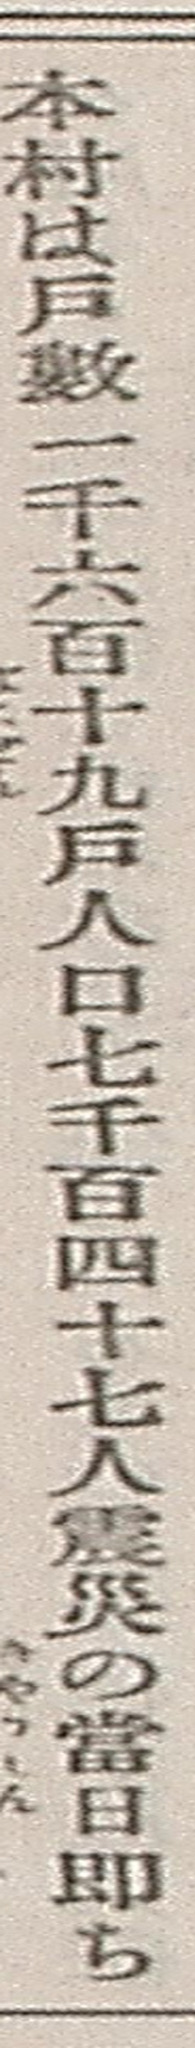本村は戸数一千六百十九戸人口七千百四十七人震災の当日即ち
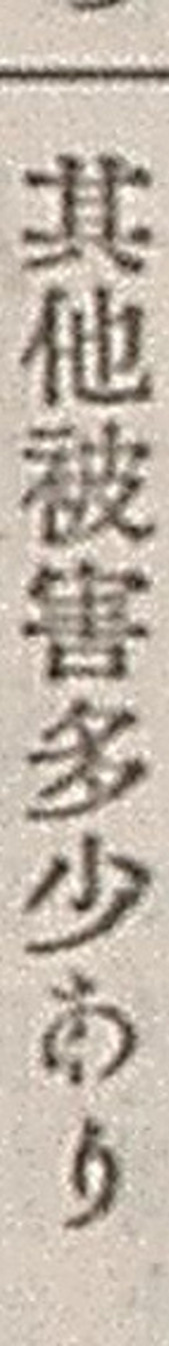其他被害多少あり
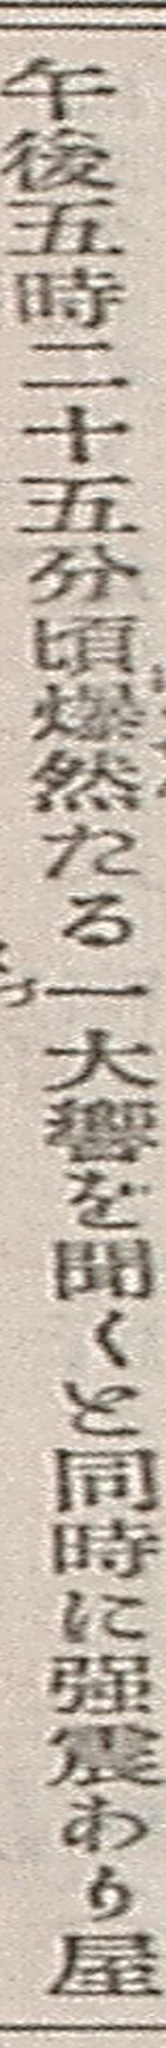午後五時二十五分頃爆然たる一大響を聞くと同時に強震あり屋
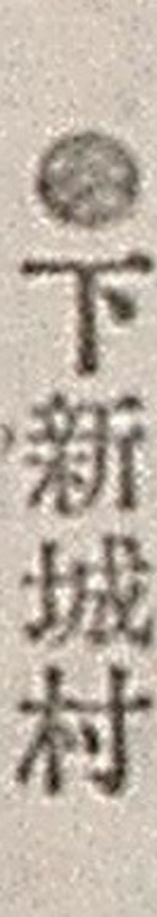●下新城村
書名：風俗畫報臨時増刊第百二十四號　洪水地震被害録（上）
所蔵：東京大学地震研究所図書室 Earthquake Research Institute Library, The University of Tokyo, JAPAN
